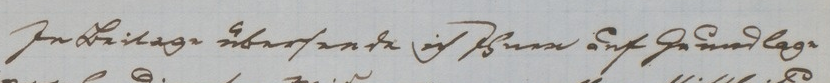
In Beilage übersende ich Ihnen auf Grundlage
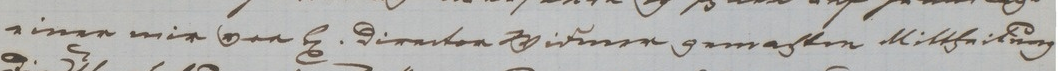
einer mir von Hr. Director Widmer gemachten Mittheilung
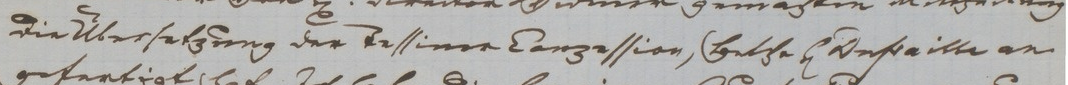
die Übersetzung der Tessiner Conzession, welche Hr Dufraille an-
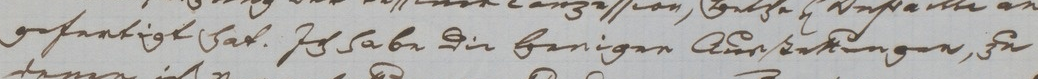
gefertigt hat. Ich habe die wenigen Ausstellungen, zu
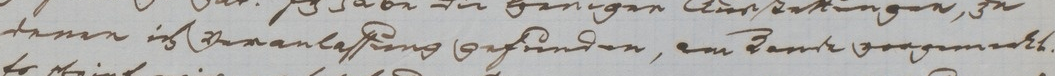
denen ich Veranlassung gefunden, am Rande vorgemerkt.
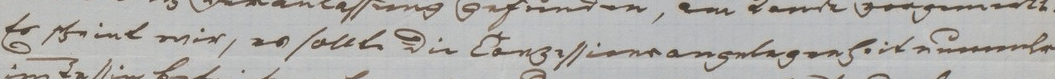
Es scheint mir, es sollte die Conzessionsangelegenheit nunmehr
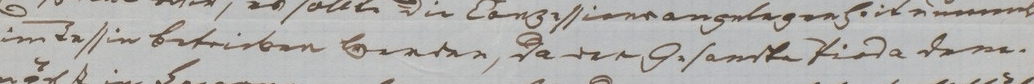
im Tessin betrieben werden, da der Gesandte Pioda dem-
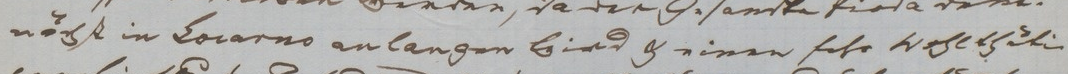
nächst in Locarno anlangen wird & einen sehr wohlthäti-
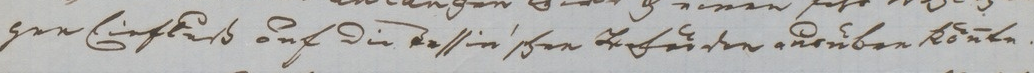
gen Einfluss auf die Tessin'schen Behörden ausüben könnte.
